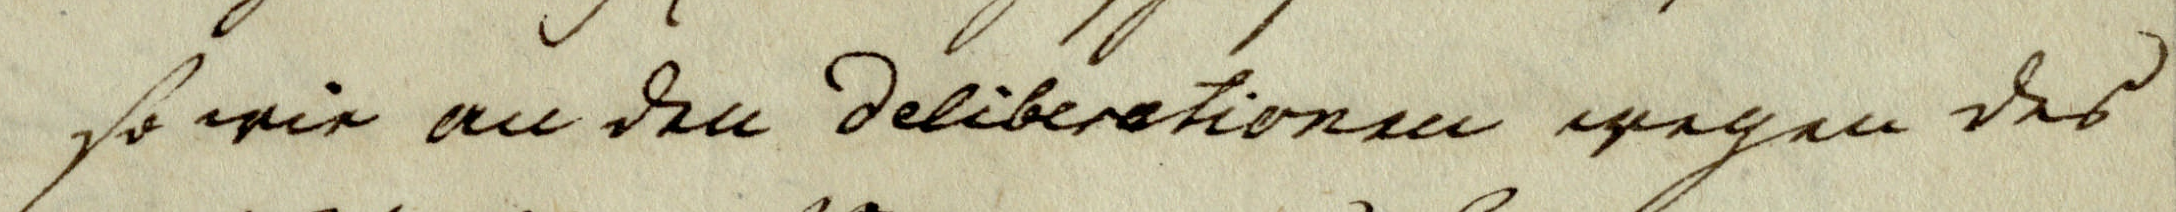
so wie an den Deliberationen wegen des
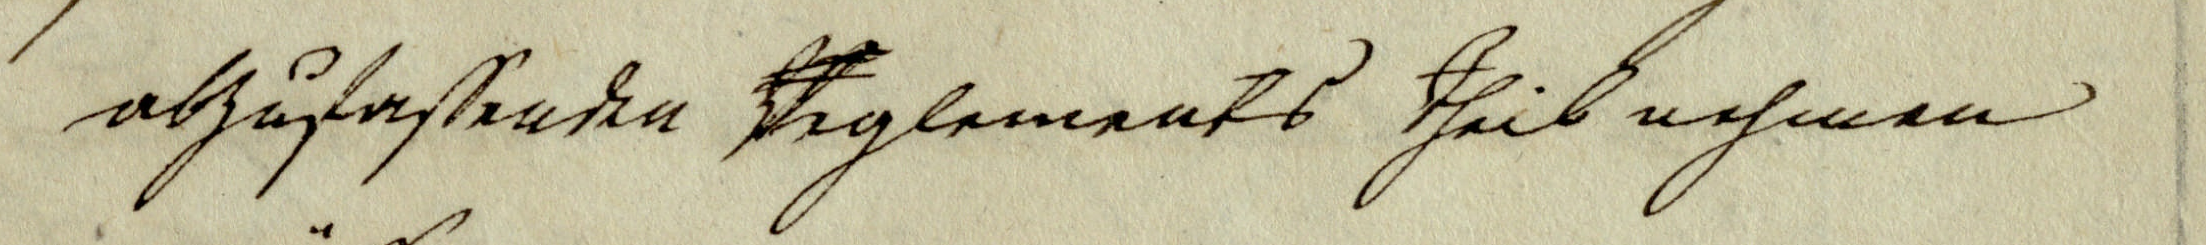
abzufassenden Reglements Theil nehmen
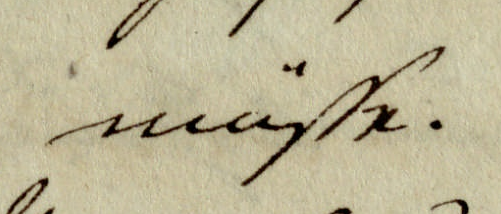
müsse.
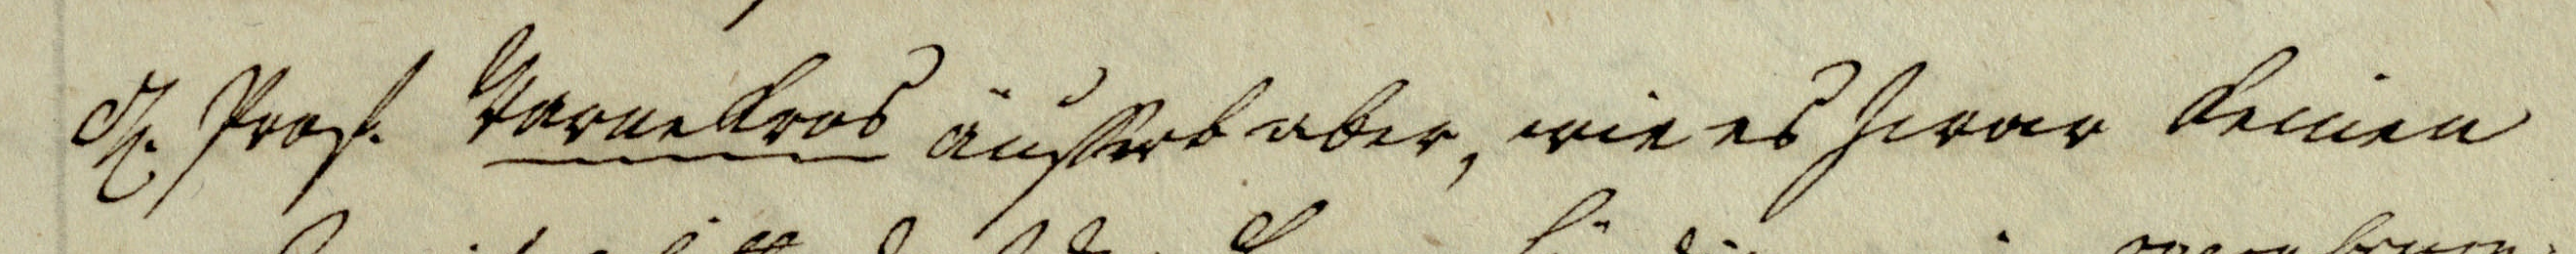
dh. Prof. Warnekros äussert aber, wie es zwar keinen
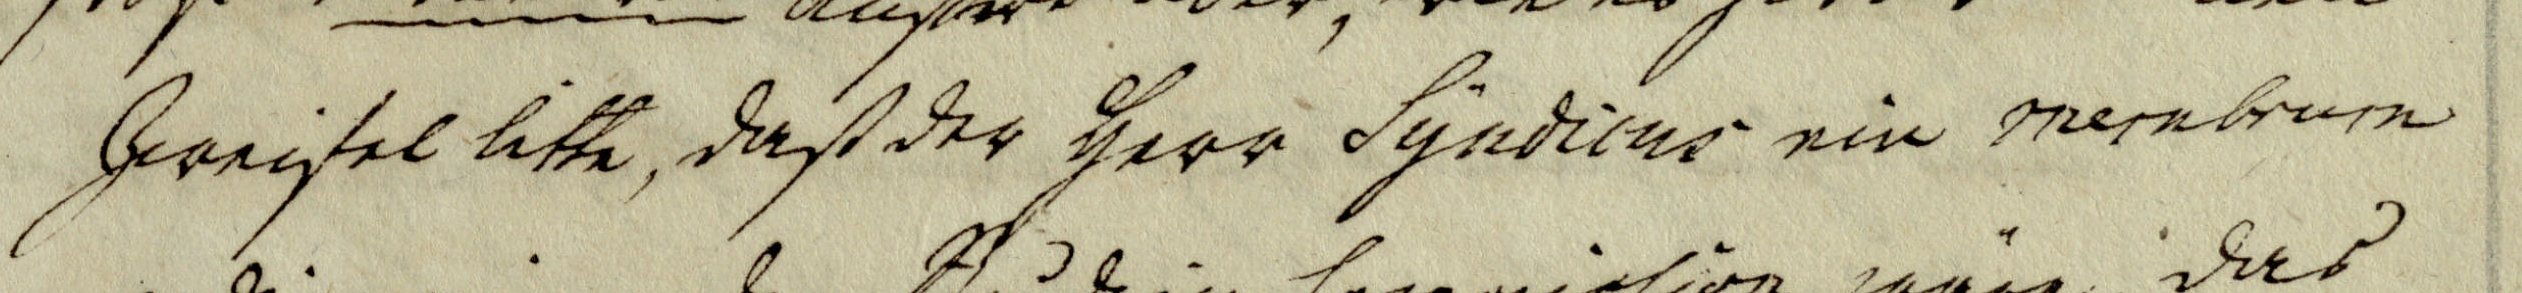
Zweifel litte, daß der Herr Sÿndicus ein membrum
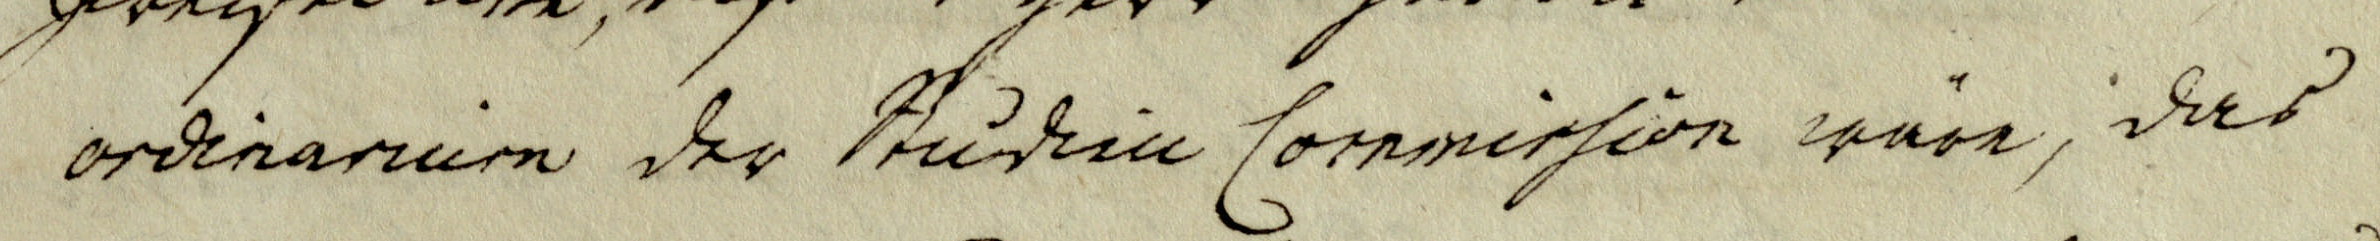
ordinarium der Studien Commission wäre, das
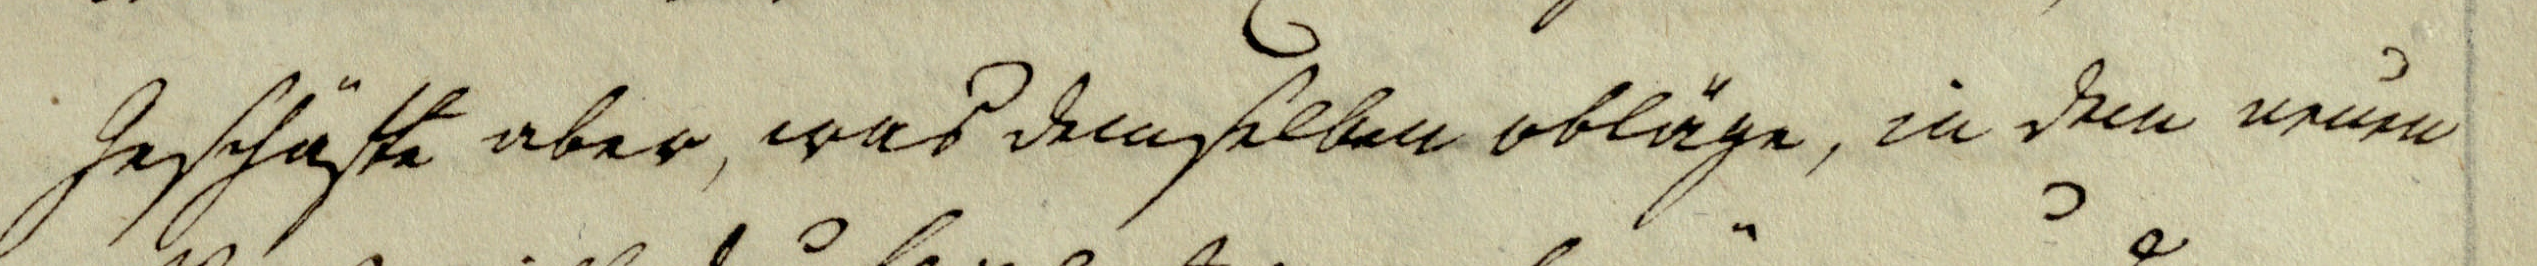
Geschäfte aber, was demselben obläge, in dem neuen
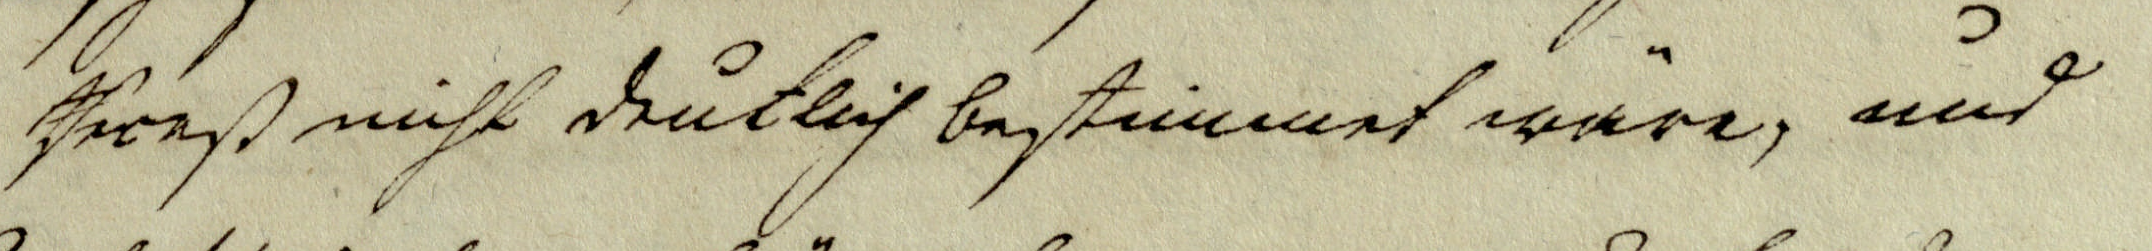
Receß nicht deutlich bestimmet wäre, und
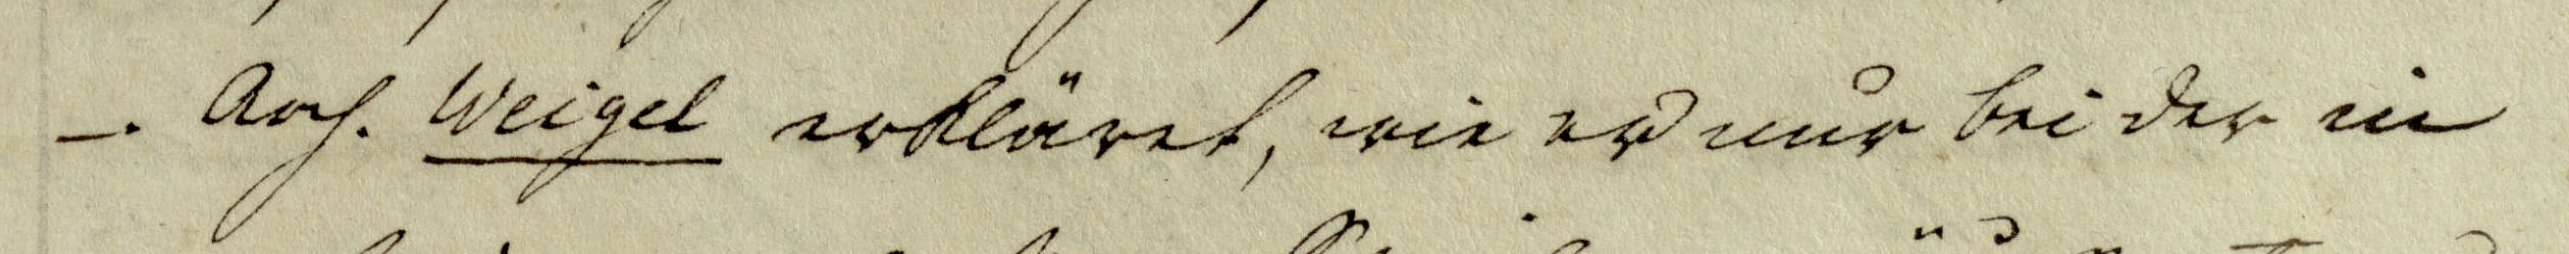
Arch. Weigel erkläret, wie er nur bei der in
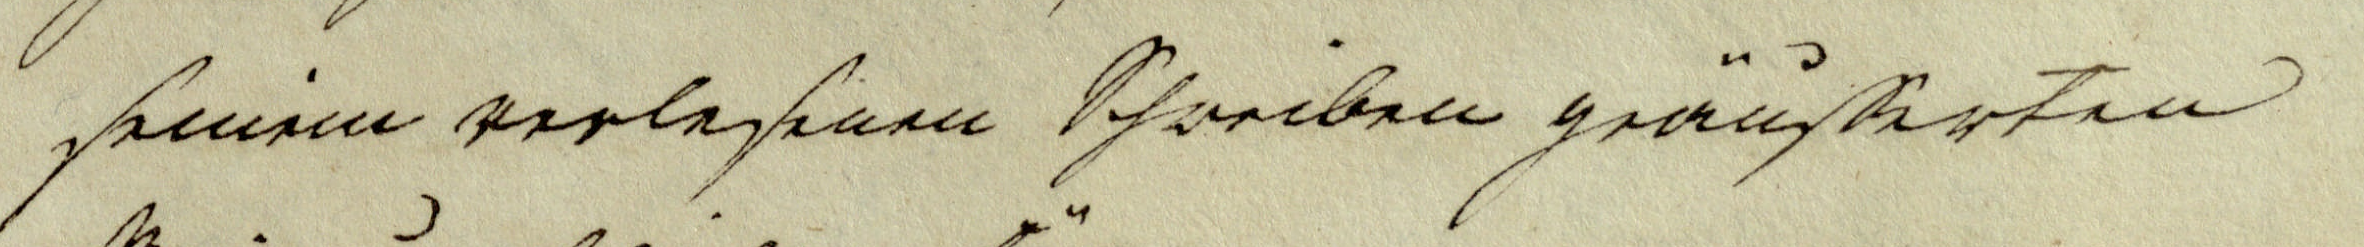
seinem verlesenen Schreiben geäusserten
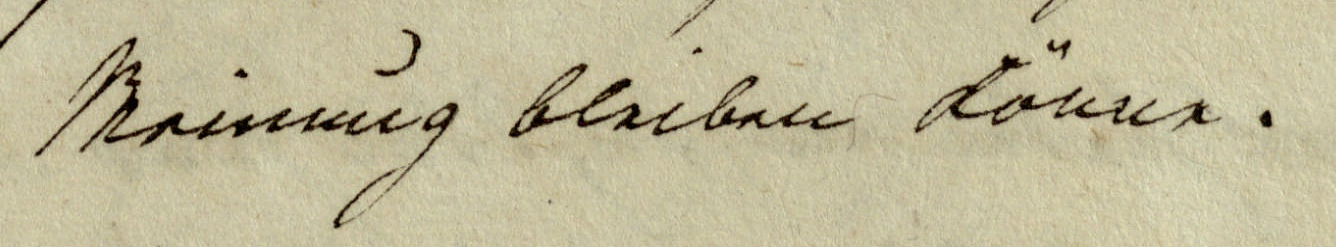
Meinung bleiben könne.
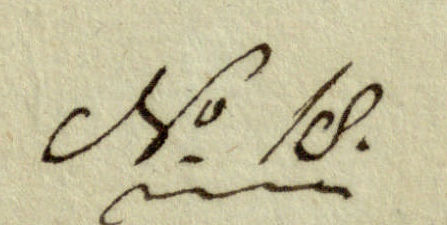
No 18.
